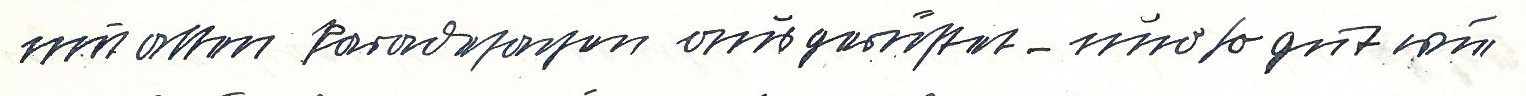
mit allen Paradesachen ausgerüstet – und so gut wie
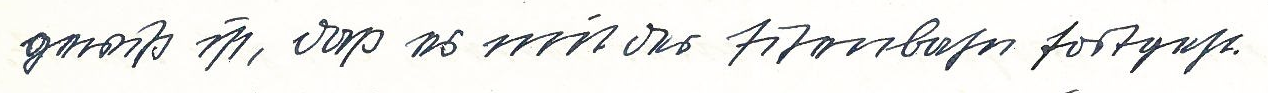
gewiß ist, daß es mit der Eisenbahn fortgeht.
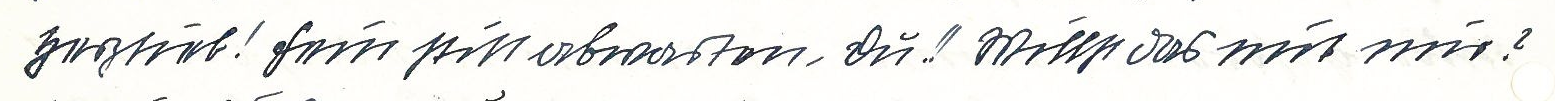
Herzlieb! Fein still abwarten, Du!! Willst das mit mir?
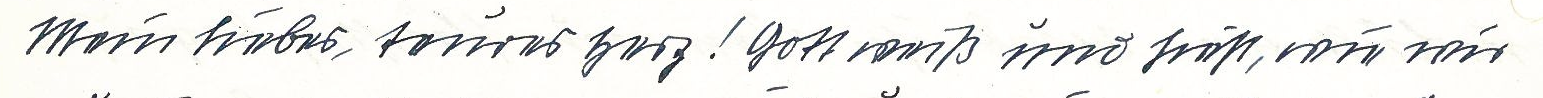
Mein liebes, teures Herz! Gott weiß und sieht, wie wir
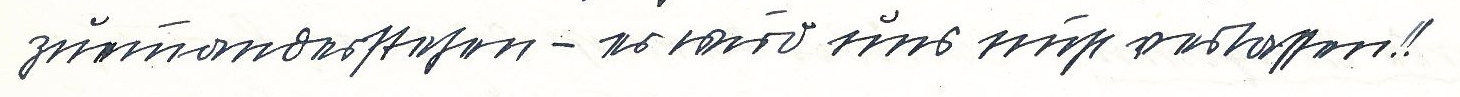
zueinander stehen – er wird uns nicht verlassen!!
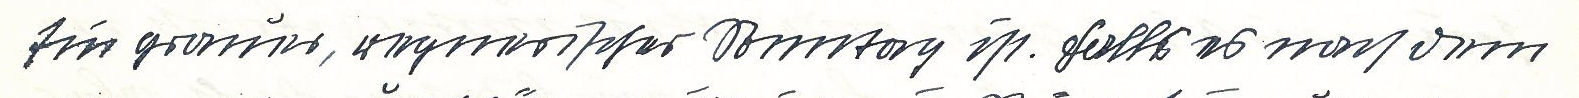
Ein grauer, regnerischer Sonntag ist. Falls es nach dem
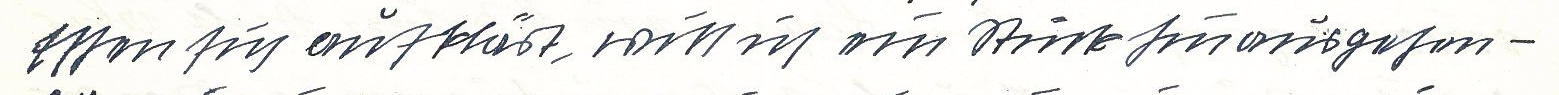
Essen sich aufklärt, will ich ein Stück hinausgehen –
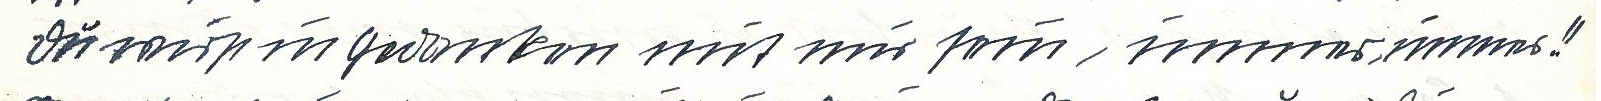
Du wirst in Gedanken mit mir sein, immer, immer!!
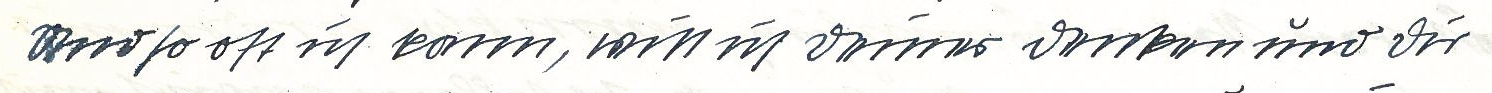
Und so oft ich kann, will ich Deiner denken und Dir
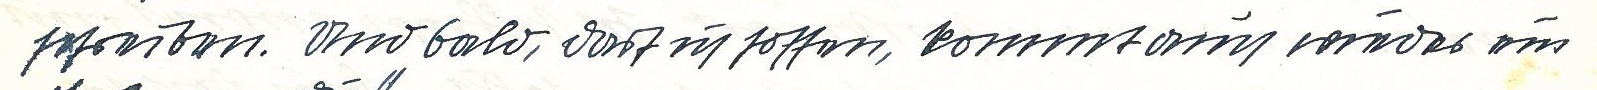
schreiben. Und bald, darf ich hoffen, kommt auch wieder ein
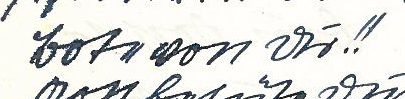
Bote von Dir!!
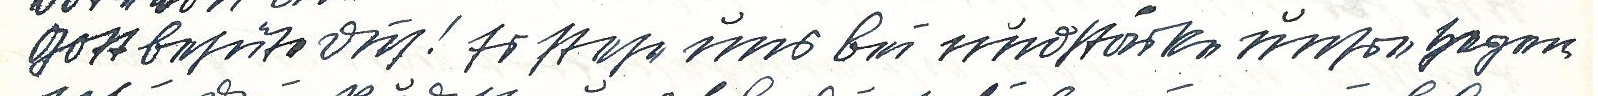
Gott behüte Dich! Er stehe uns bei und stärke unsre Herzen.
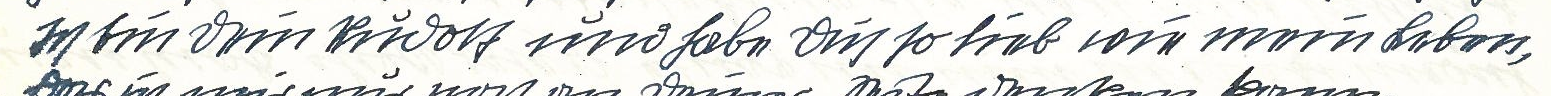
Ich bin Dein und habe Dich so lieb wie mein Leben,
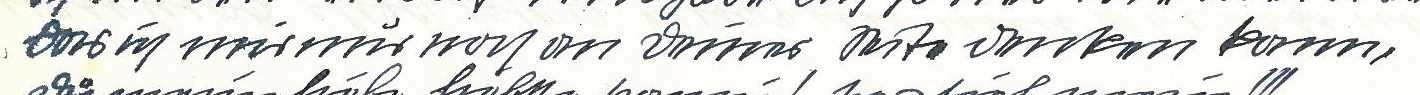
das ich mir nur noch an Deiner Seite denken kann,
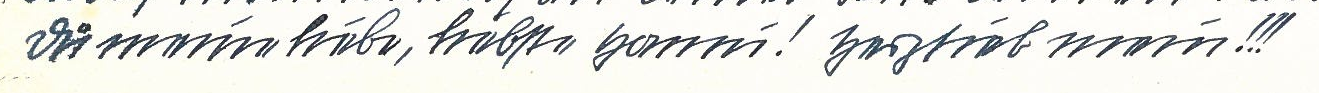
Du meine liebe, liebste! Herzlieb mein!!!
